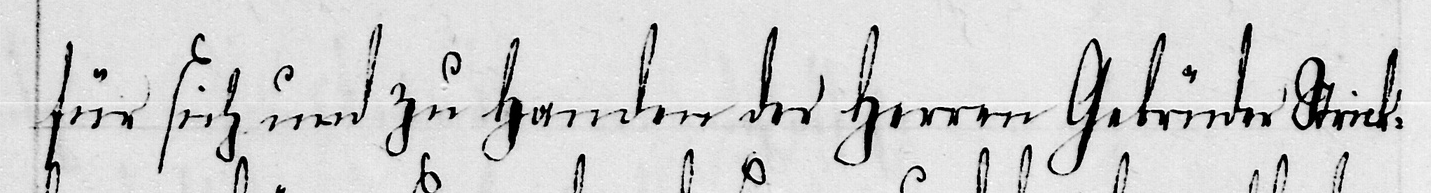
für sich und zu Handen der Herren Gebrüder Stric¬
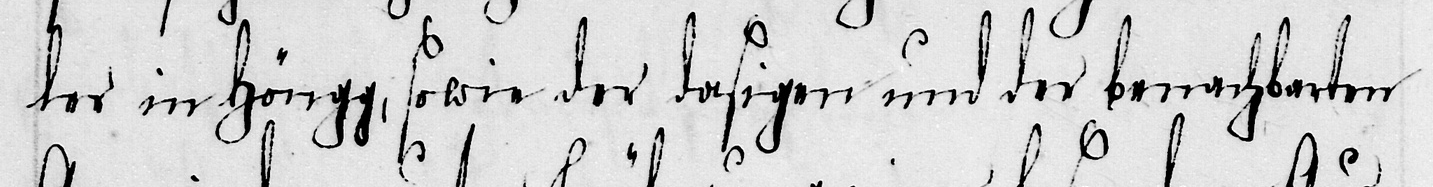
kler in Höngg, sowie der dasigen und benachbarten
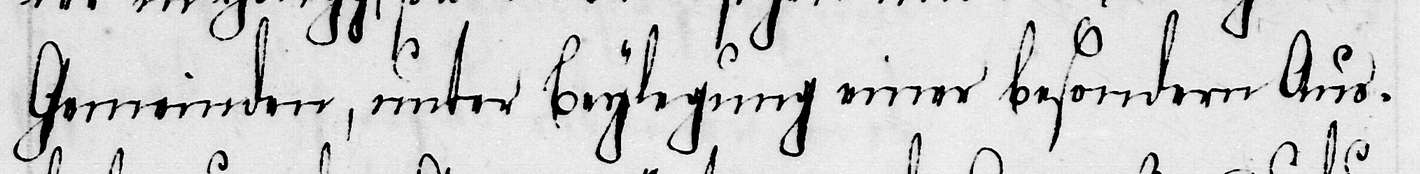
Gemeinden, unter Beylegung einer besondern Aus¬
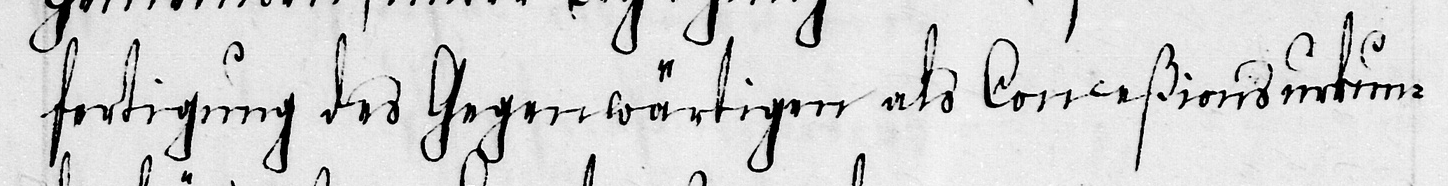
fertigung des Gegenwärtigen als Conceßionsurkun¬
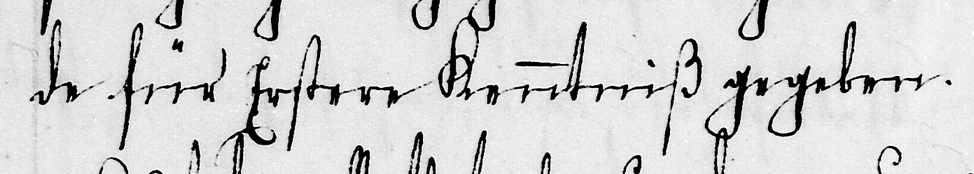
de für Erstere Kenntniß gegeben.
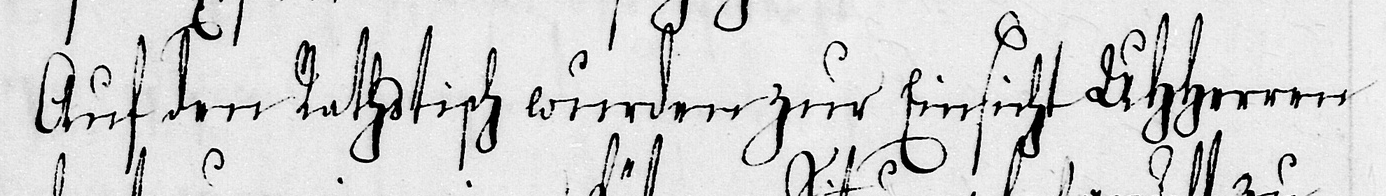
Auf den Rathstisch wurden zur Einsicht UHHerren
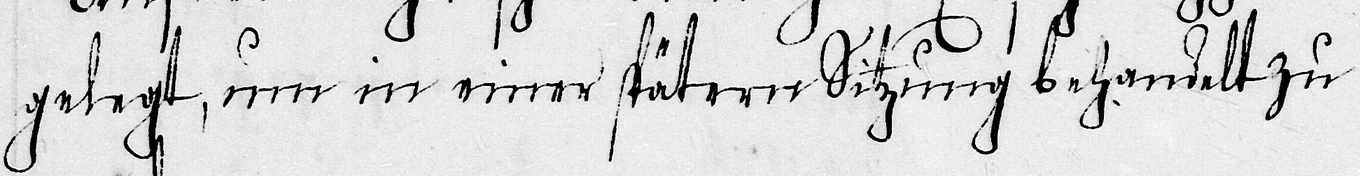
gelegt, um in einer spätern Sitzung behandelt zu
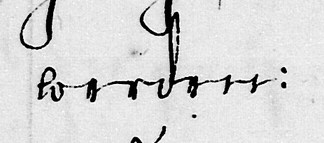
werden:
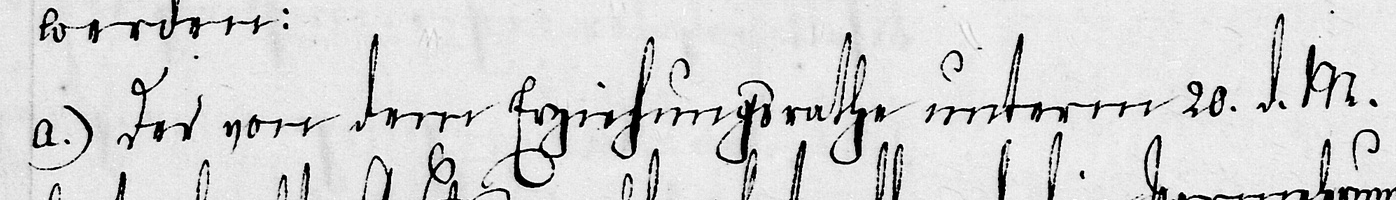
a.) Der von dem Erziehungsrathe unterm 20. d. M.
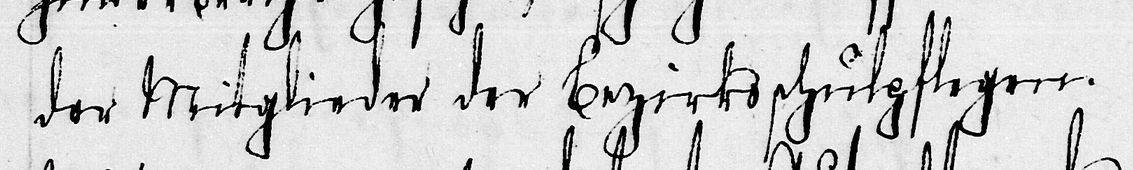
der Mitglieder der Bezirksschulpflegen.
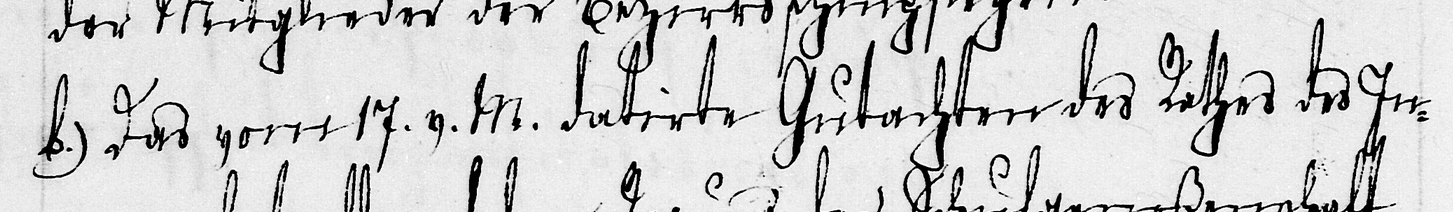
b.) Das vom 17. v. M. datirte Gutachten des Rathes des In¬
